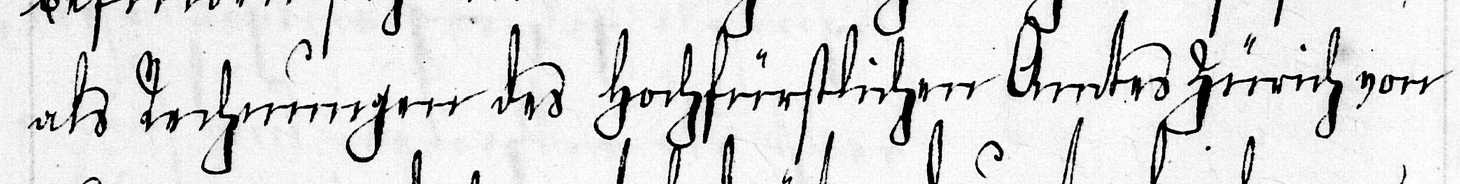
als Rechungen des Hochfürstlichen Amtes Zürich von
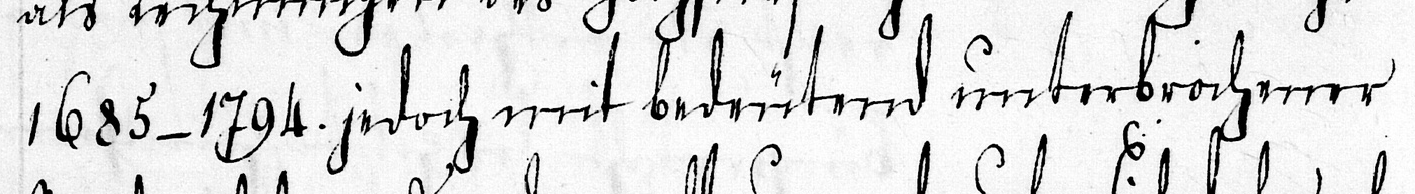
1685–1794. jedoch mit bedeutend unterbrochener
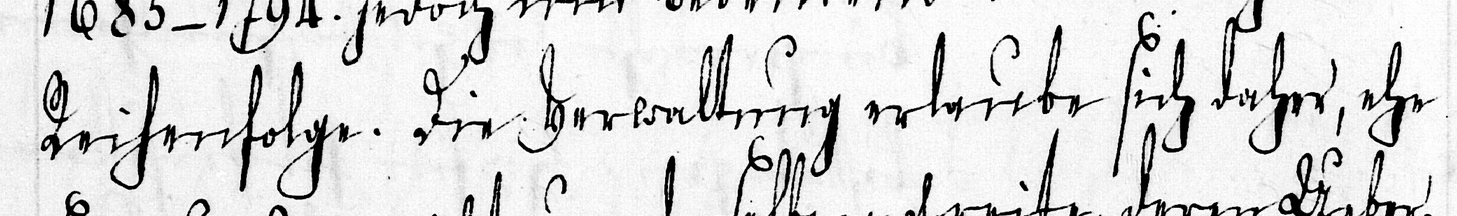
Reihenfolge. Die Verwaltung erlaube sich daher, ehe
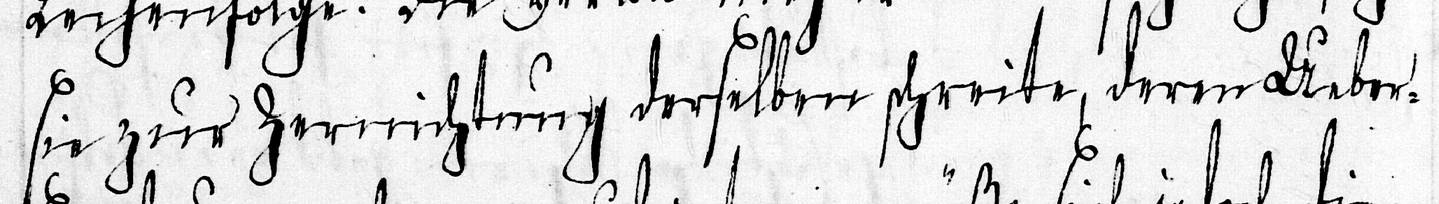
sie zur Zernichtung derselben schreite, deren Ueber¬
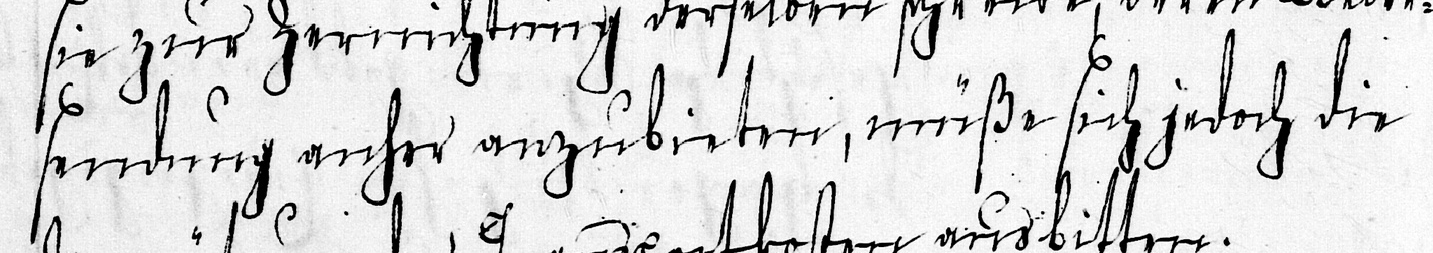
sendung anher anzubieten, müße sich jedoch die
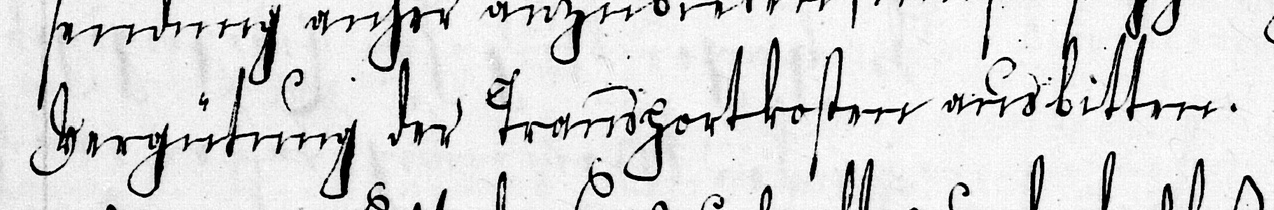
Vergütung der Transportkosten ausbitten.
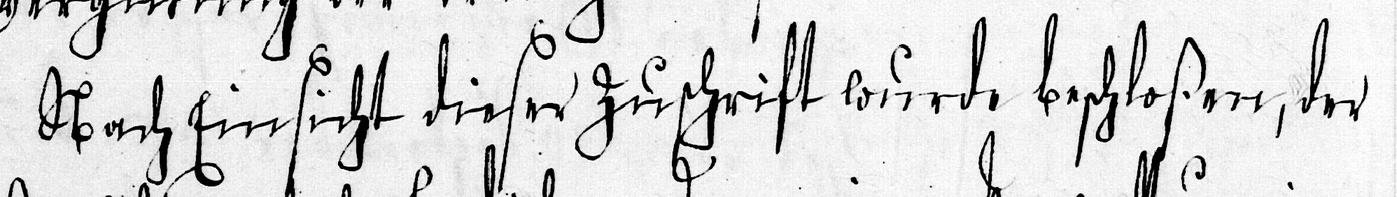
Nach Einsicht dieser Zuschrift wurde beschloßen, der
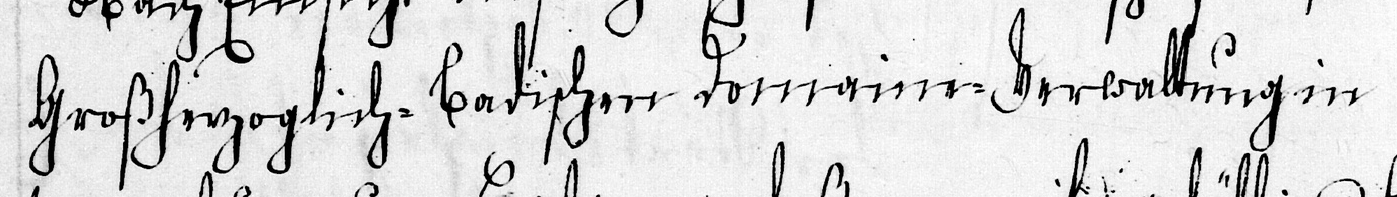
Großherzoglich-Badischen Domaine-Verwaltung in
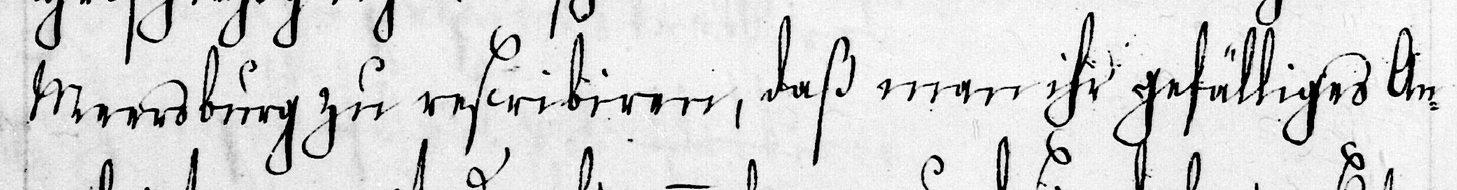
Meersburg zu rescribiren, daß man ihr gefälliges An¬
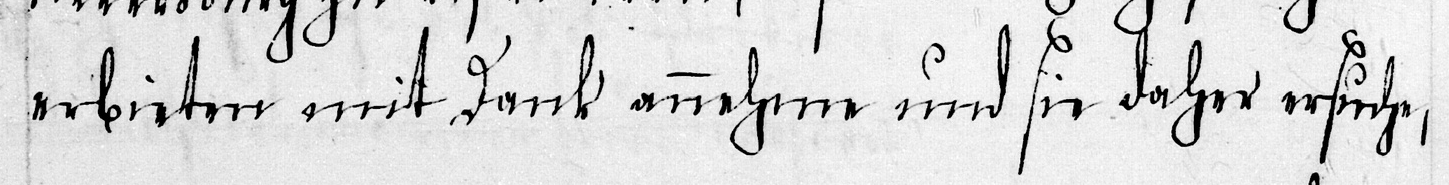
erbieten mit Dank annehme und sie daher ersuche,
